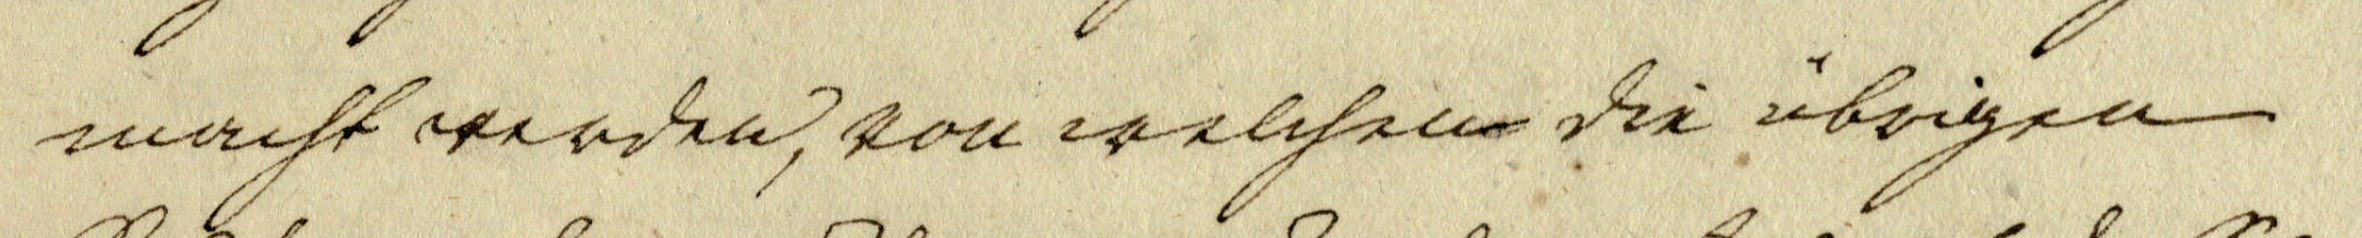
macht werden, von welchem die übrigen
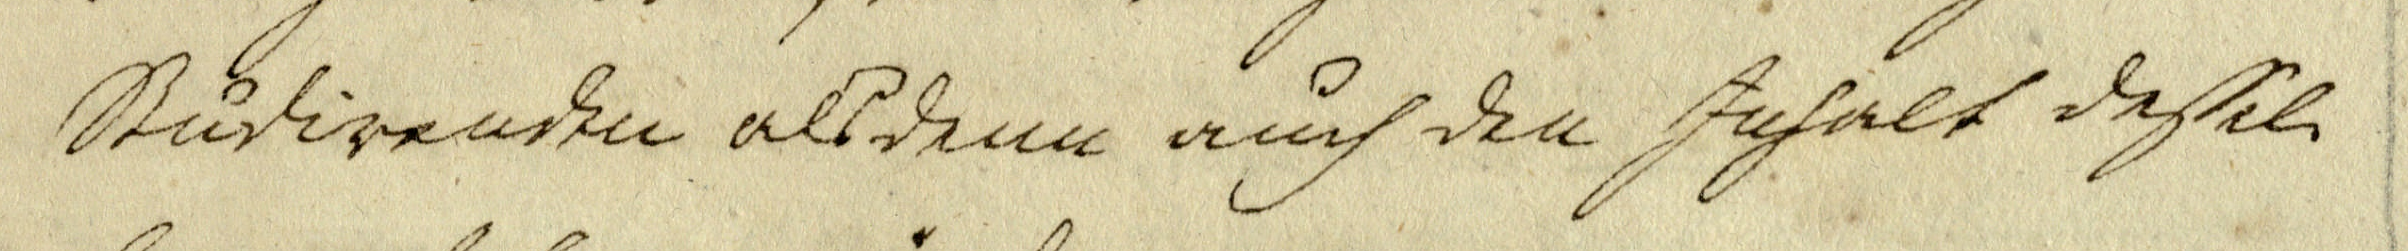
Studirenden als denn auch den Inhalt dessel¬
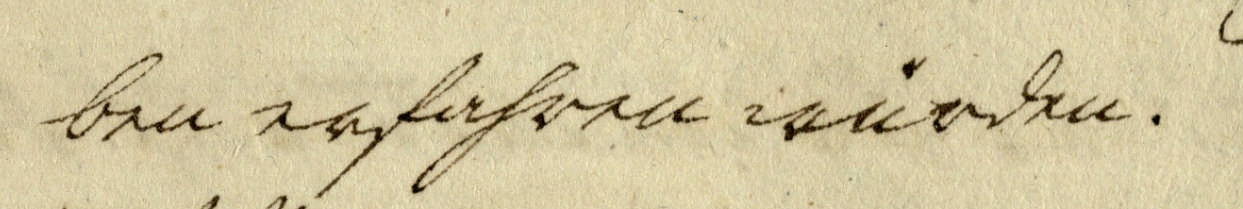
ben erfahren würden.
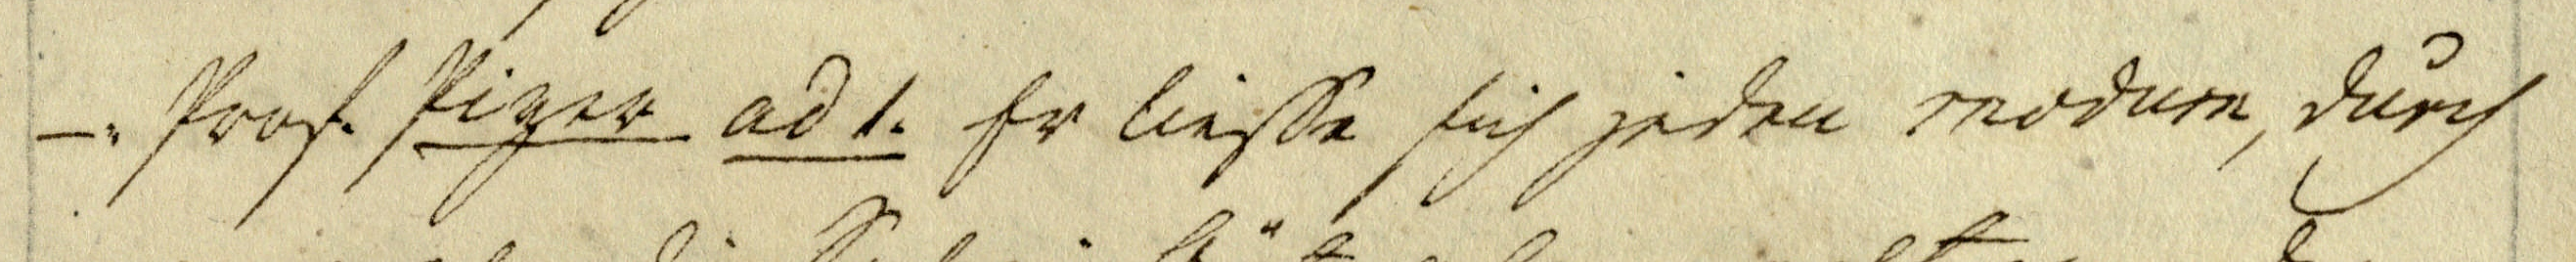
Prof. Piper. ad 1. Er liesse sich jeden modum, durch
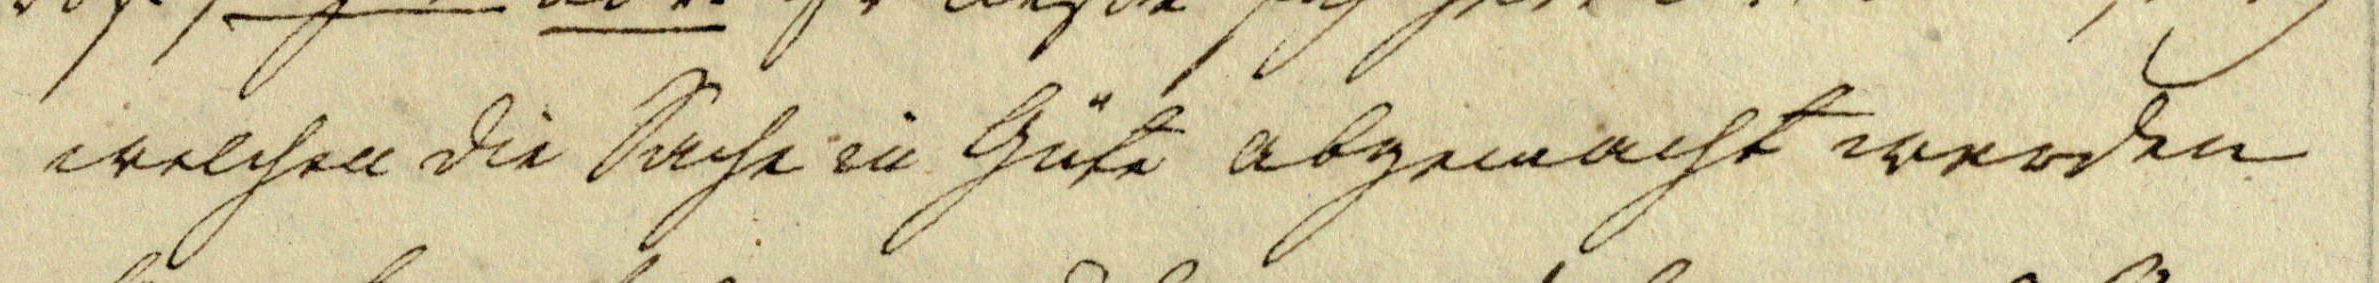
welchen die Sache in Güte abgemacht werden
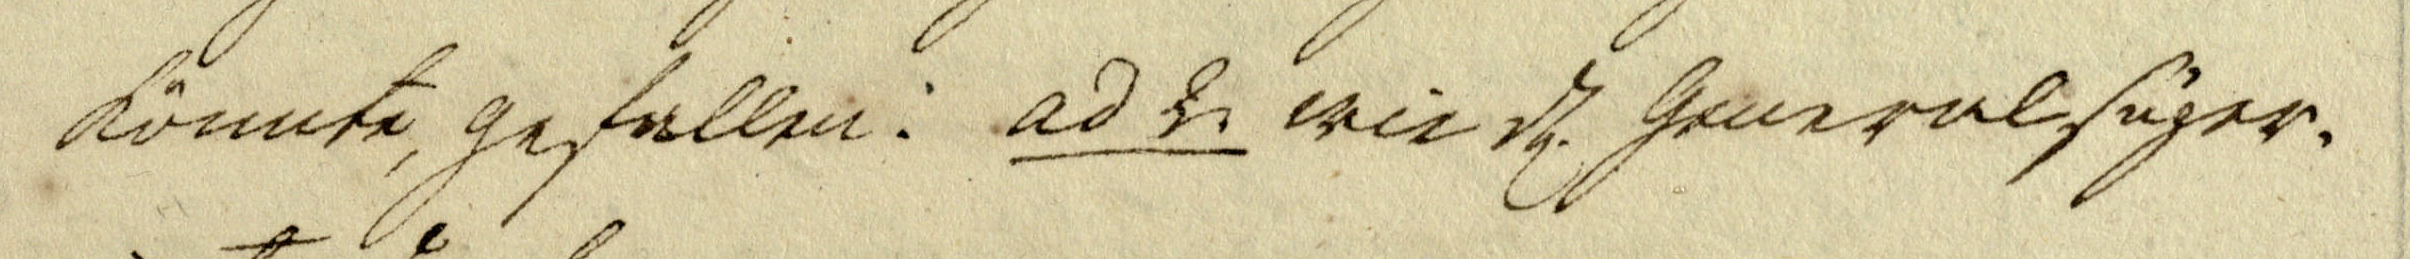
könnte, gefallen. ad 2. wie dh. Generalsuper¬
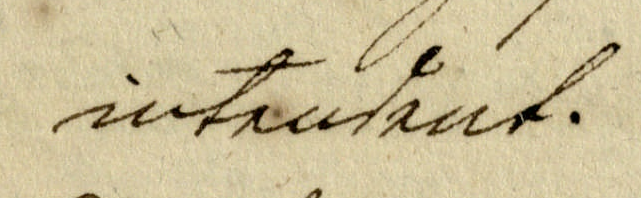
intendent.
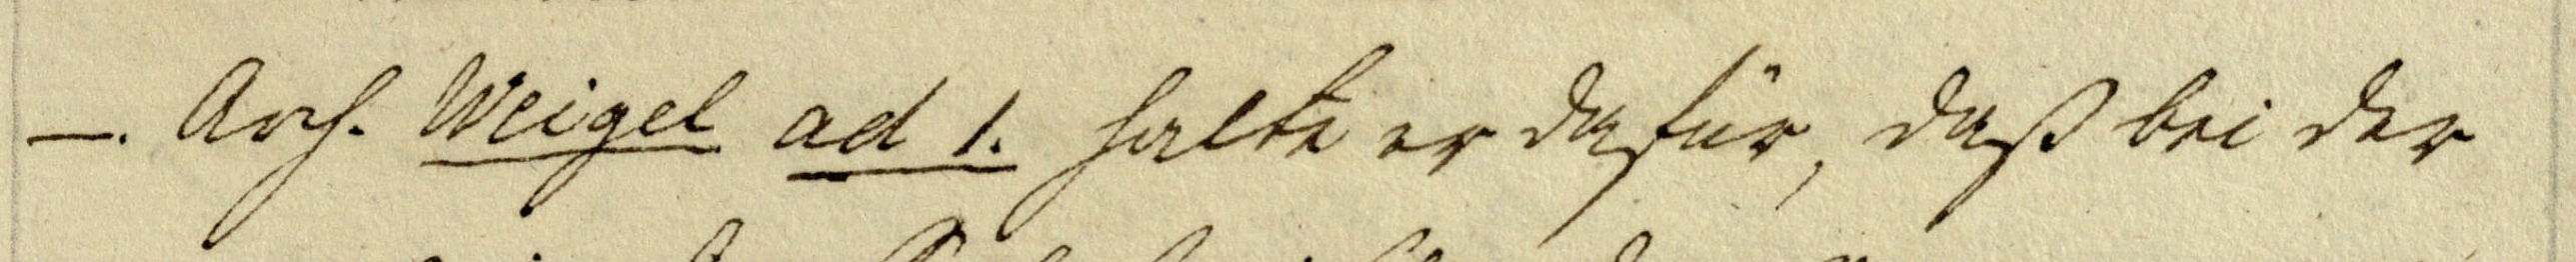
Arch. Weigel ad 1. halte er dafür, daß bei der
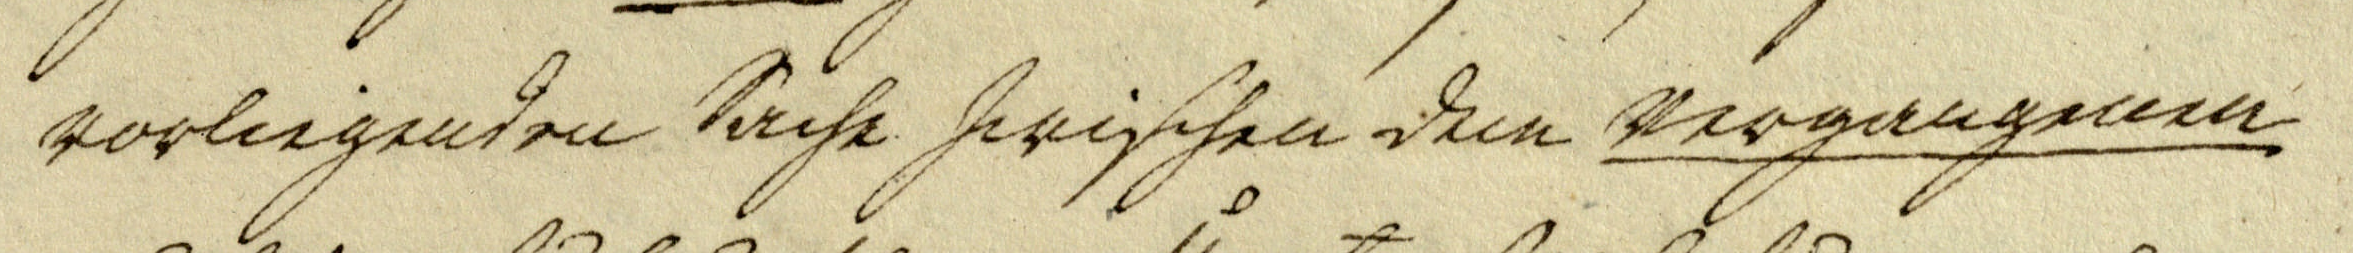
vorliegenden Sache zwischen dem vergangenen
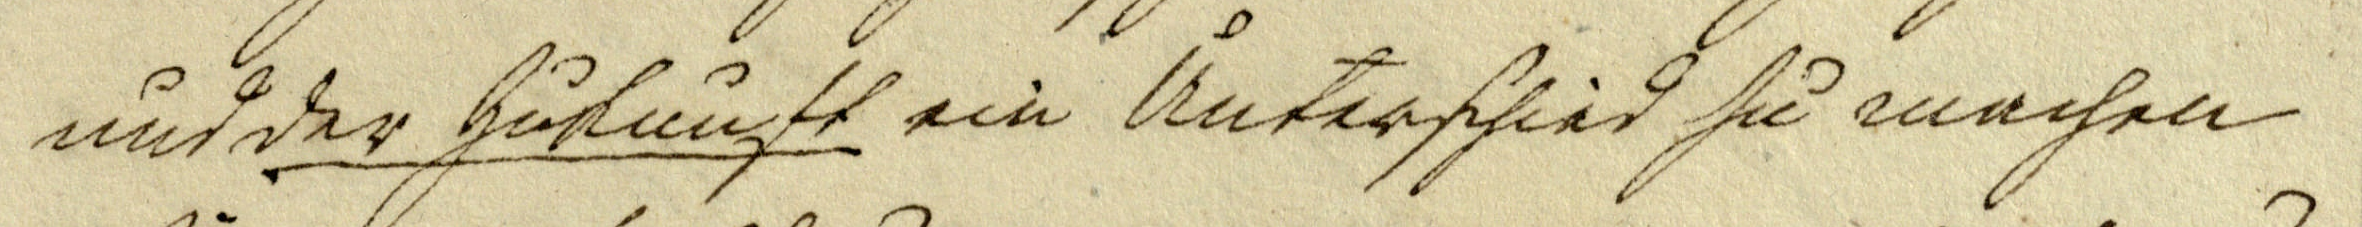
und der Zukunft ein Unterschied zu machen
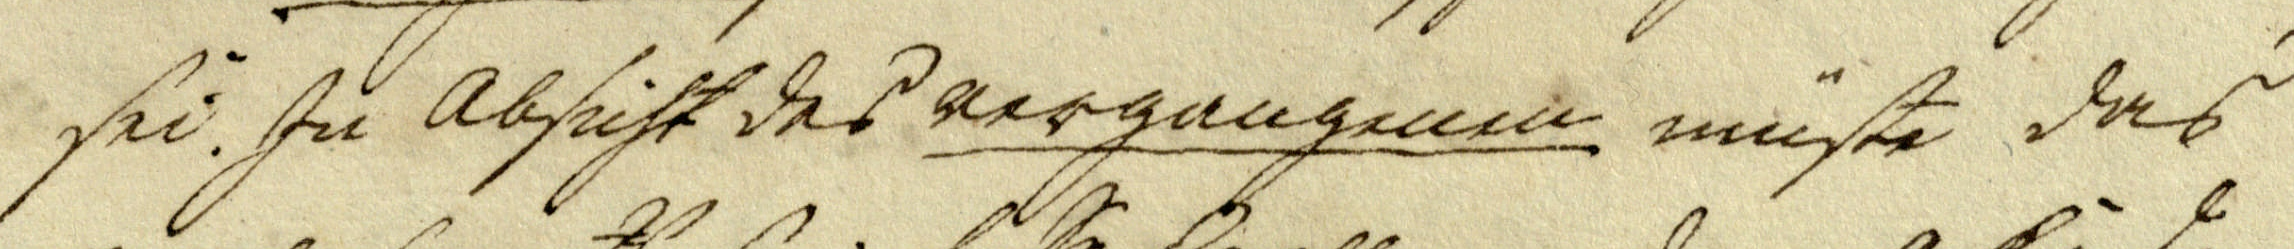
sei. In Absicht des vergangenen müßte das
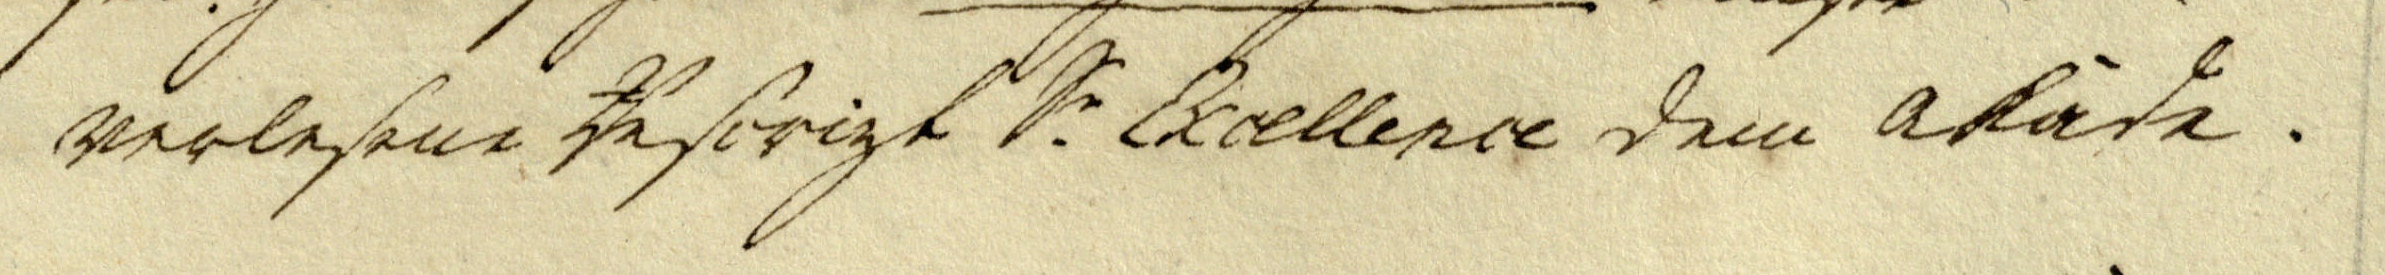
verlesene Rescript Sr. Excellence dem Akade¬
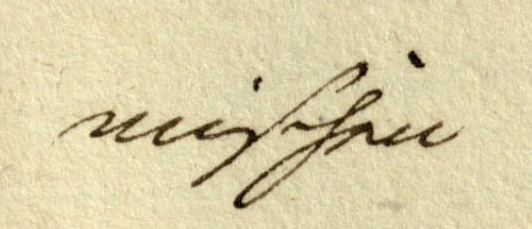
mischen
